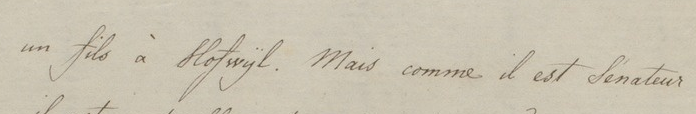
un fils à Hofwyl. Mais comme il est Sénateur
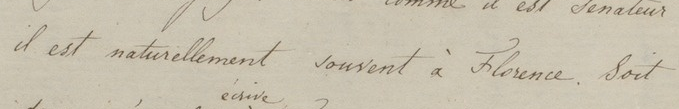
il est naturellement souvent à Florence. Soit
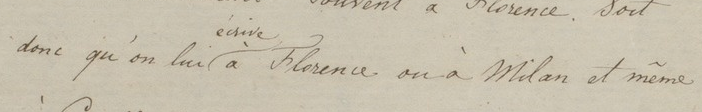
donc qu'on lui écrive à Florence ou à Milan et même
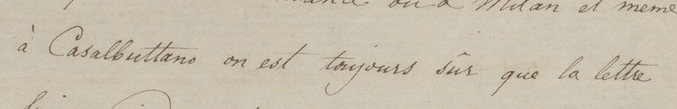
à Casalbuttano on est toujours sûr que la lettre
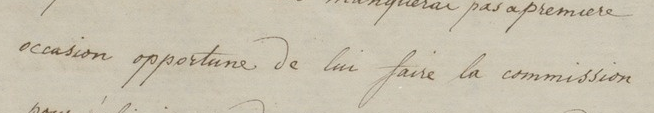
occasion opportune de lui faire la commission
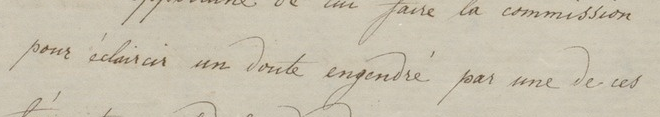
pour éclaircir un doute engendré par une de ces
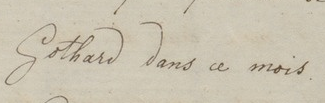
Gothard dans ce mois.
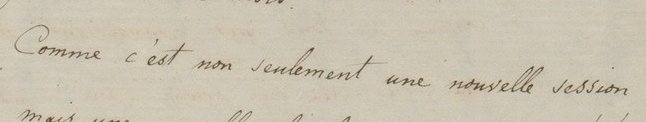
Comme c'est non seulement une nouvelle session
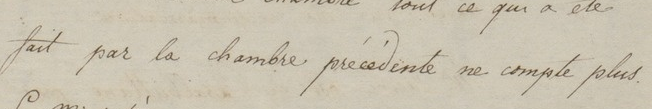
fait par la chambre précédente ne compte plus.
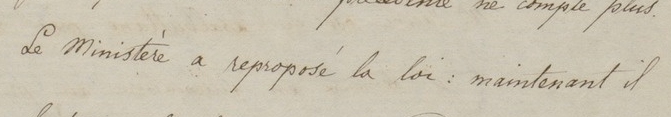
Le Ministère a reproposé la loi: maintenant il
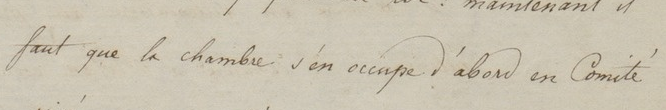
faut que la chambre s'en occupe d'abord en Comité
